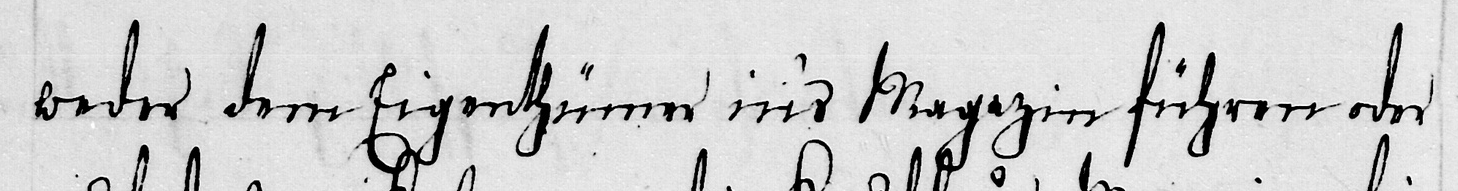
weder dem Eigenthümer in’s Magazin führen oder
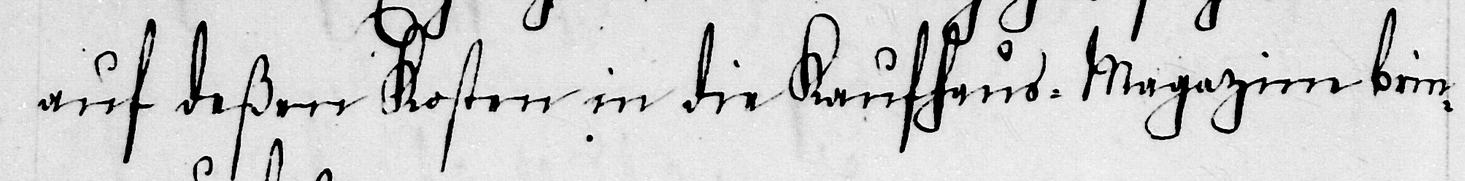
auf deßen Kosten in die Kaufhaus-Magazine brin¬
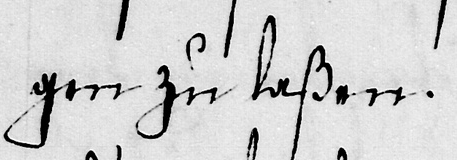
gen zu laßen.
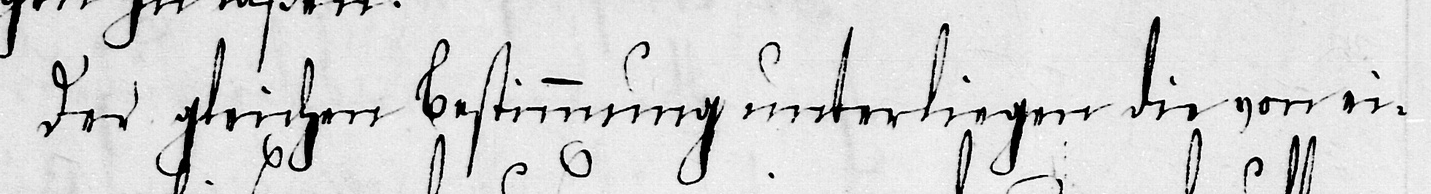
Der gleichen Bestimmung unterliegen die von ei¬
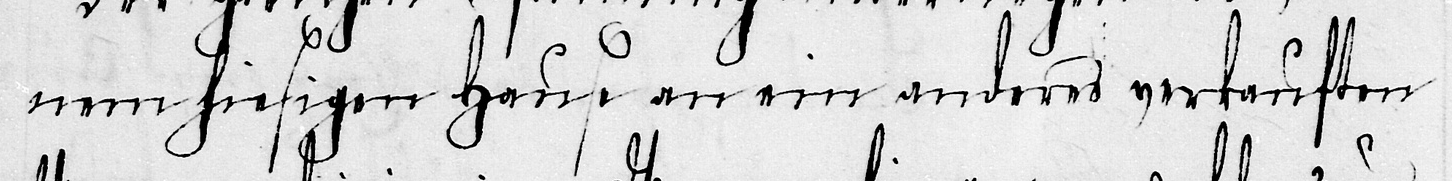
nem hiesigen Hause an ein anderes verkauften
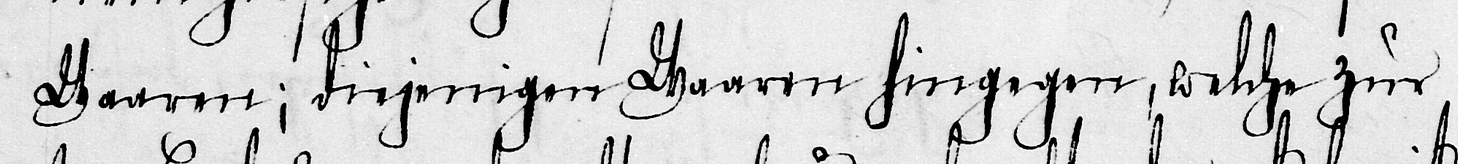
Waaren; diejenigen Waaren hingegen, welche zur
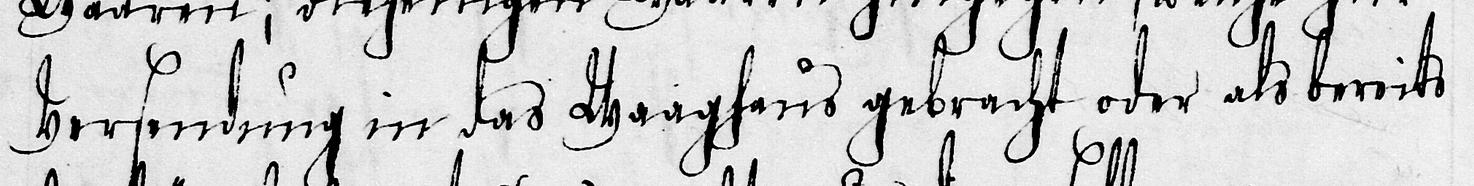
Versendung in das Waaghaus gebracht oder als bereits
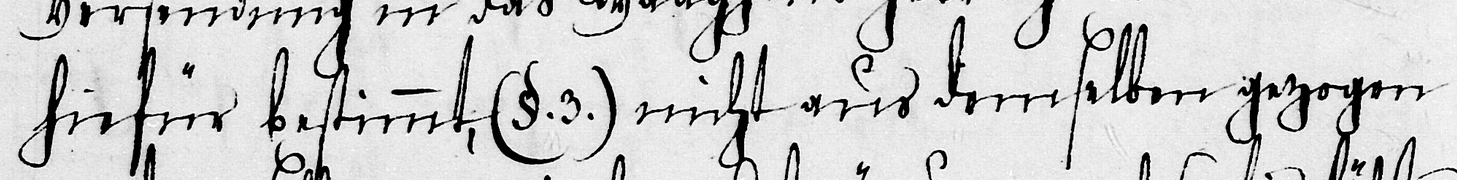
hiefür bestimmt, (§. 3.) nicht aus demselben gezogen
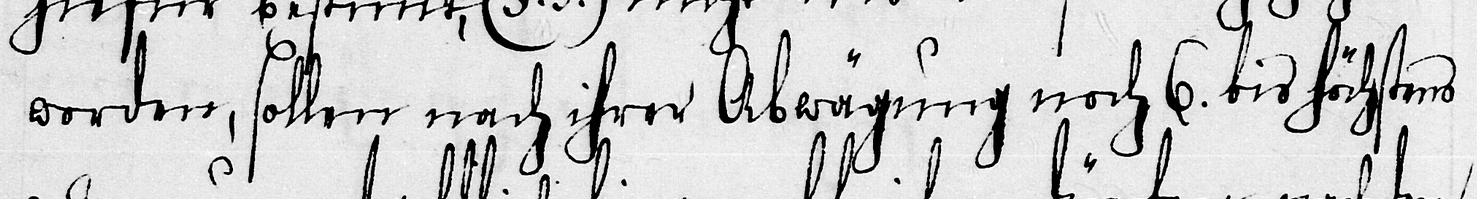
worden, sollen nach ihrer Abwägung noch 6. bis höchstens
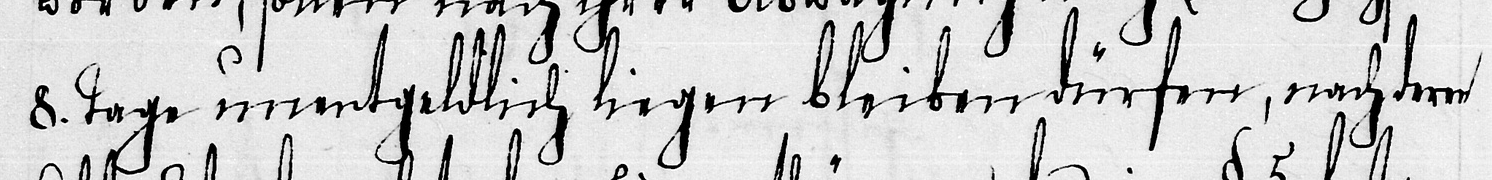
8. Tage unentgeldlich liegen bleiben dürfen, nach der¬
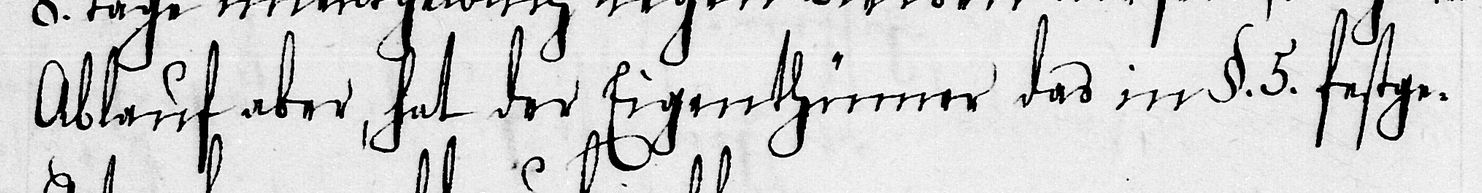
Ablauf aber, hat der Eigenthümer das in §. 5. festg¬
